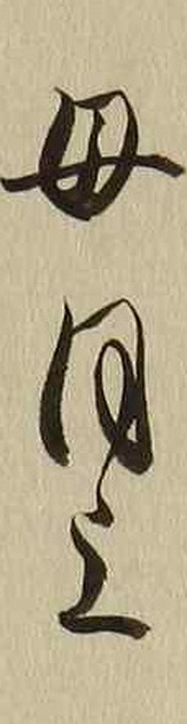母同上
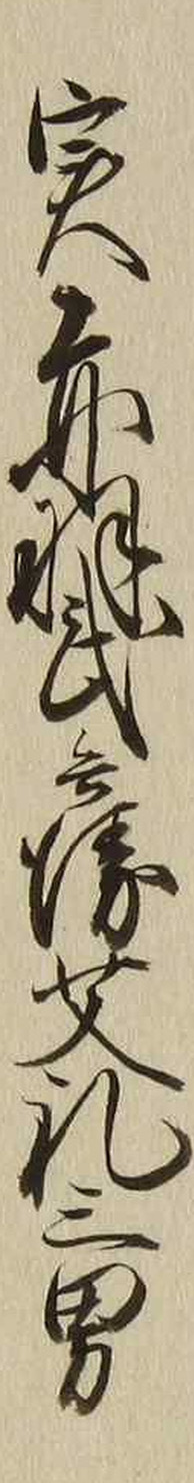実赤羽武兵衛艾礼三男
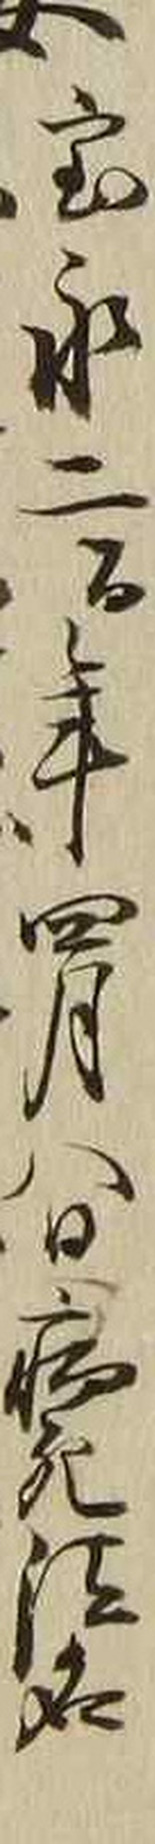宝永二酉年四月八日病死法名
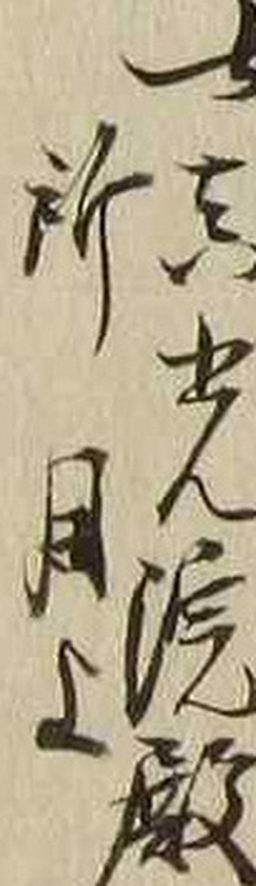所同上
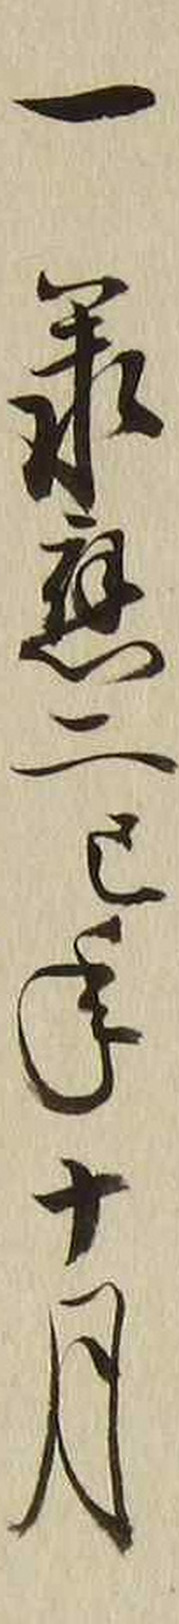一承応二巳年十月
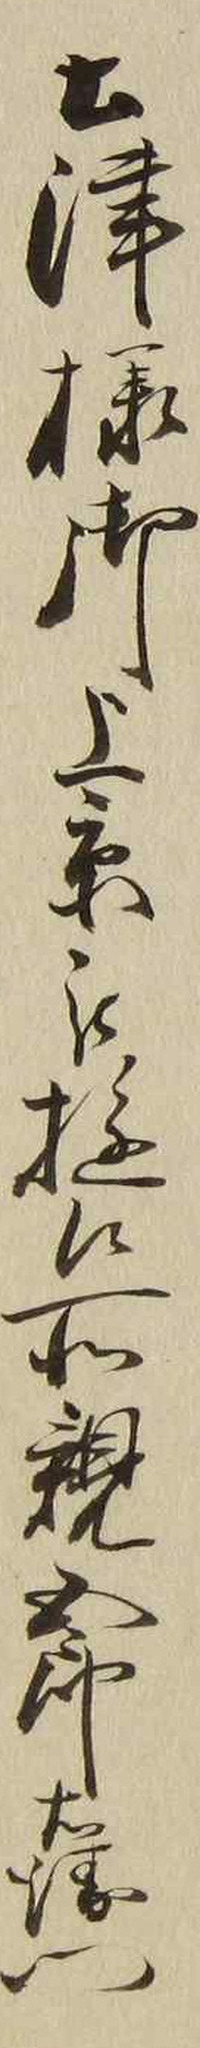土津様御上京被遊候所親五郎右衛門
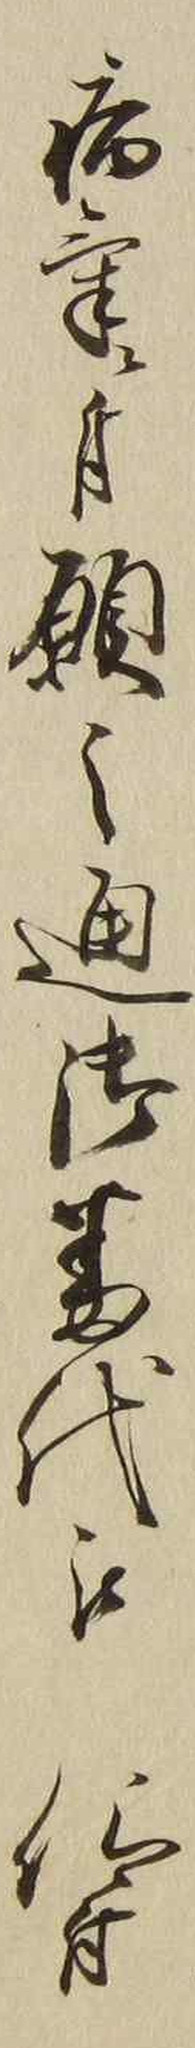病気に付願之通御番代被仰付
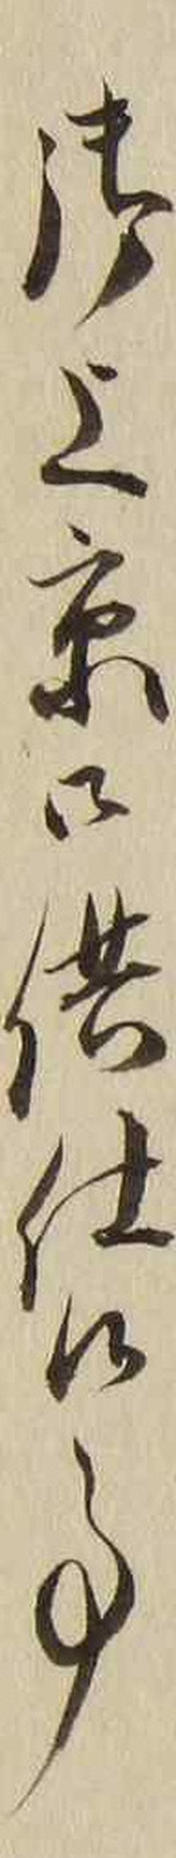御上京御供仕候事

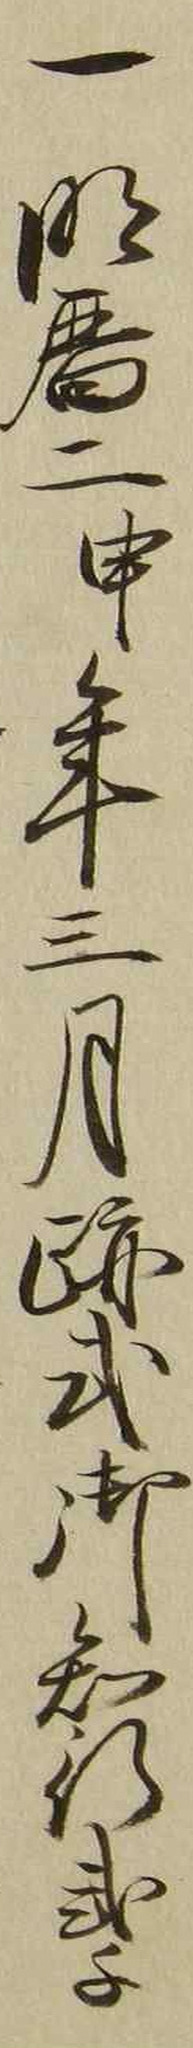一明暦二申年三月跡式御知行弐千
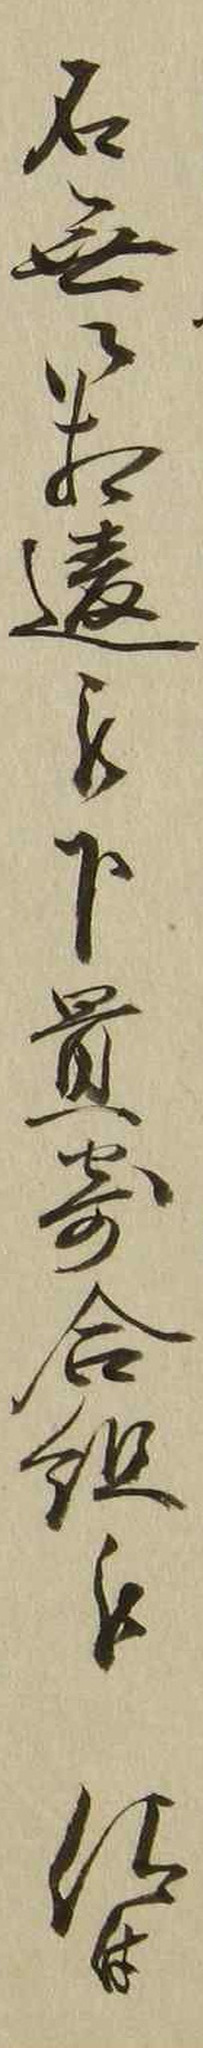石無御相違被下置寄合組被仰付
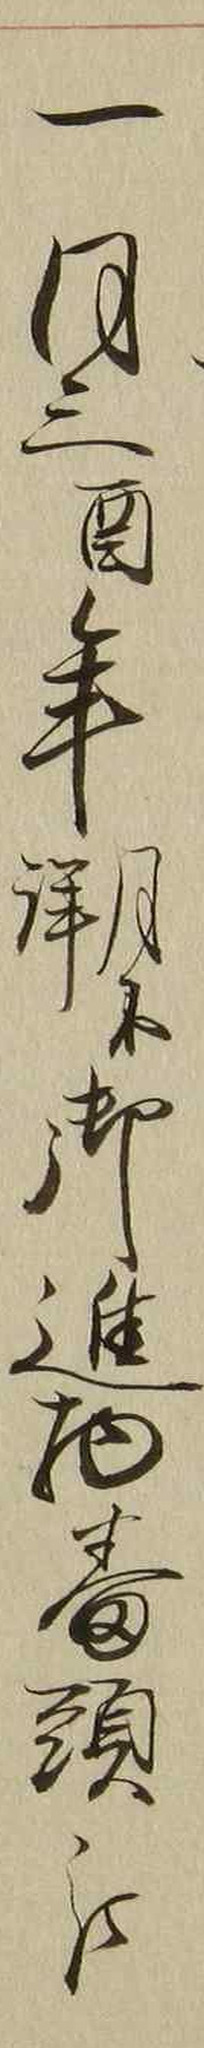一同三酉年月不詳御進物番頭被
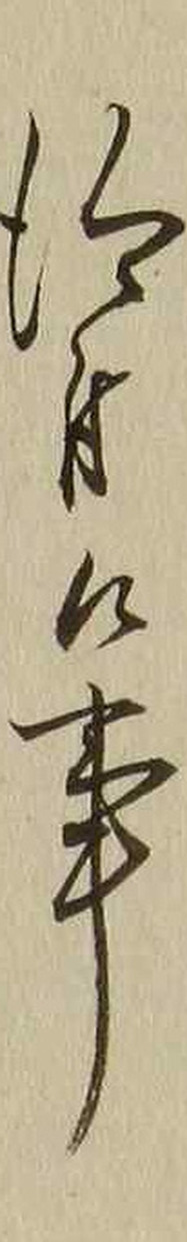仰付候事
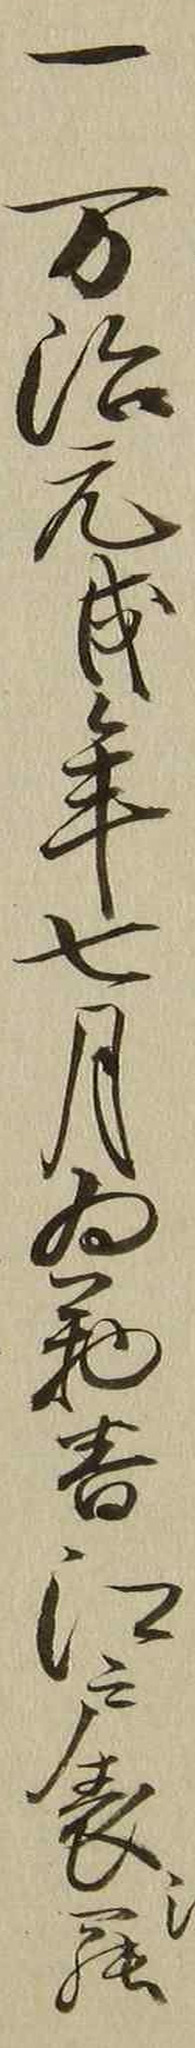一万治元戌年七月為勤番江戸表江罷
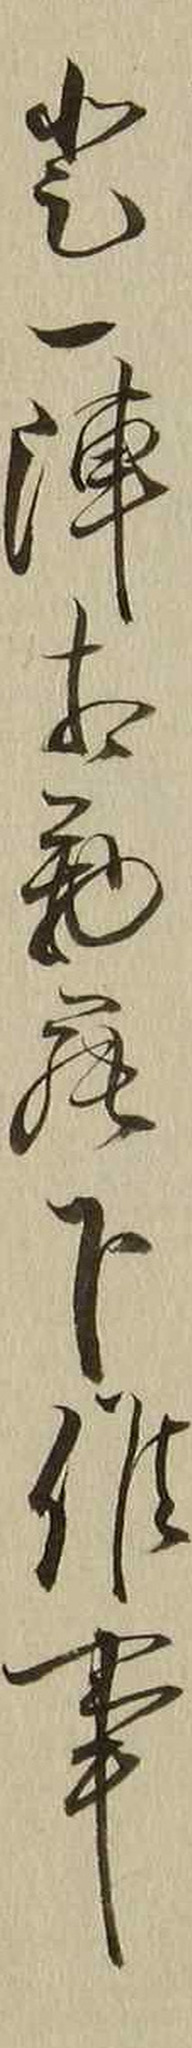登一陣相勤罷下候事
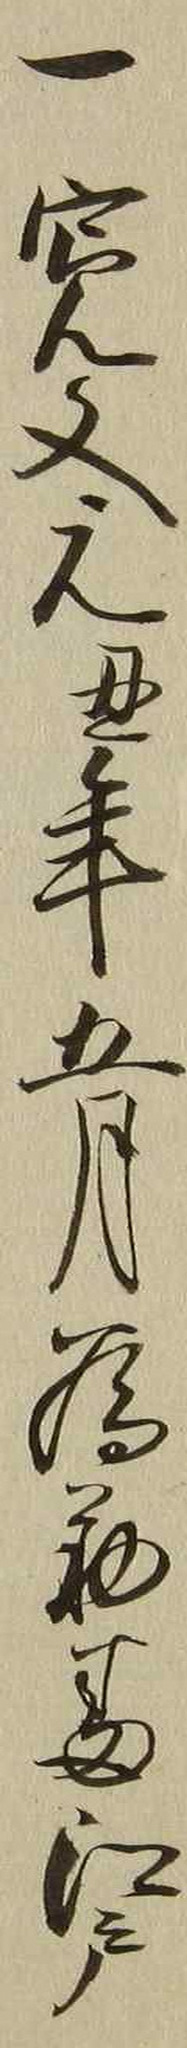一寛又元丑年五月為勤番江戸
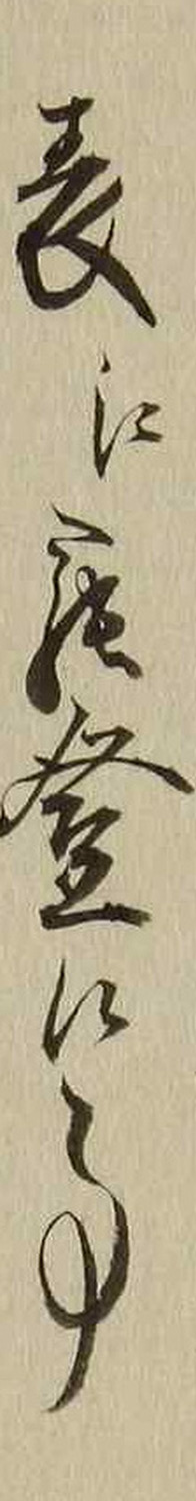表江罷登候事
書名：諸士系譜　巻之77　を之部11
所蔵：会津若松市立会津図書館
